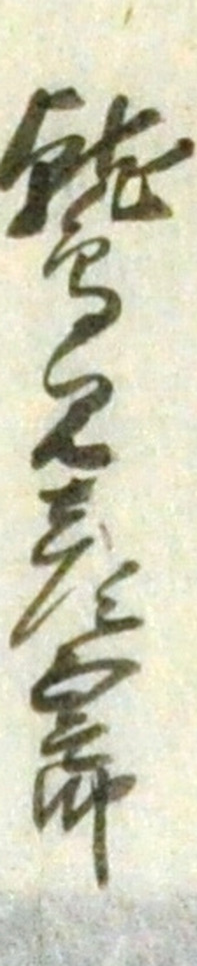鷲見彦五郎
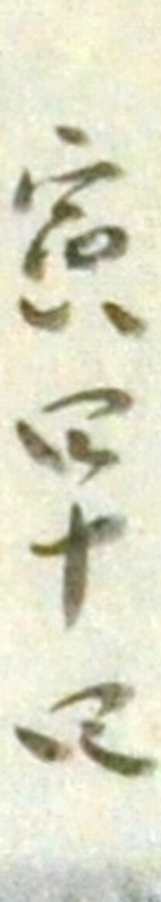寅四十四
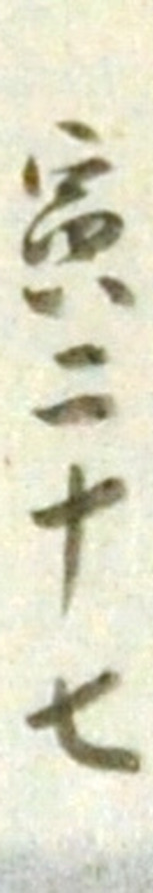寅二十七
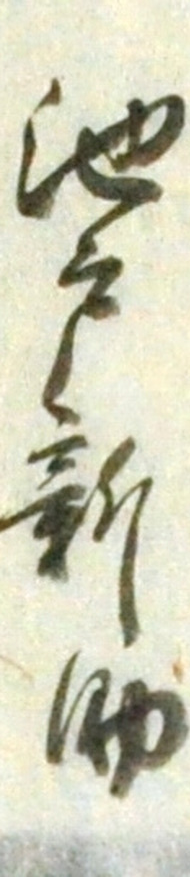池戸新助
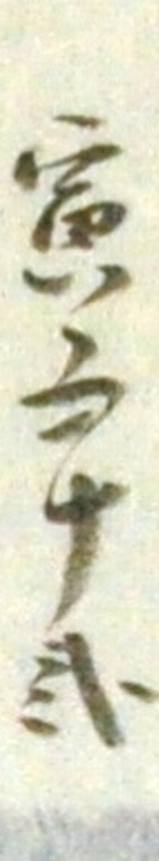寅五十弐
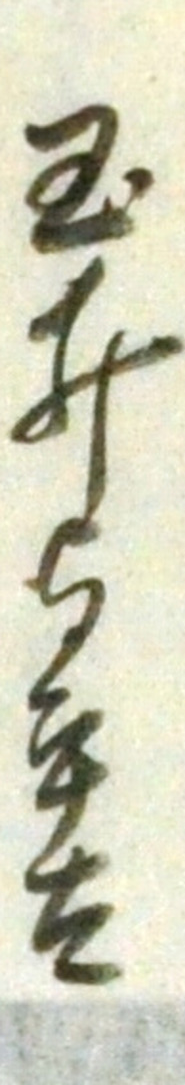玉井与平太
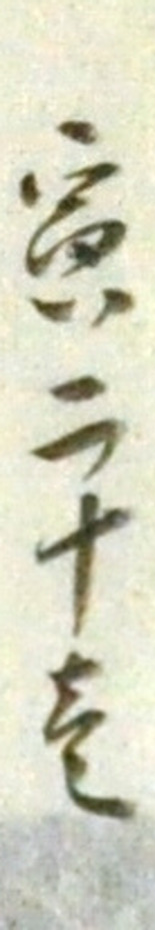寅二十壱
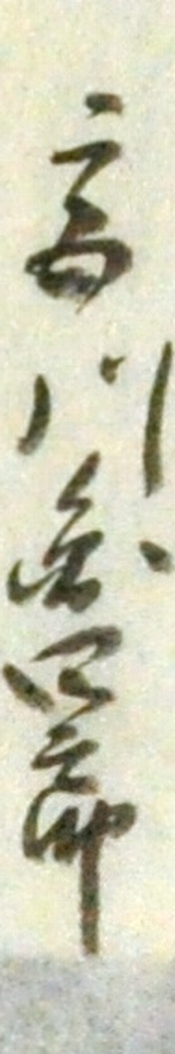宮川円四郎
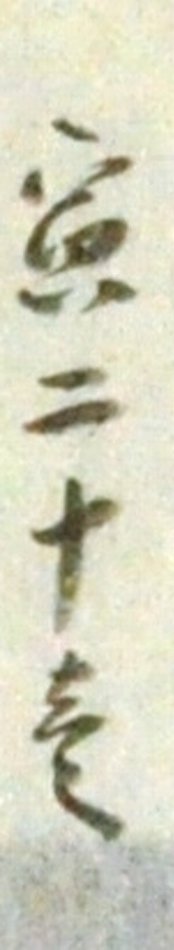寅二十壱
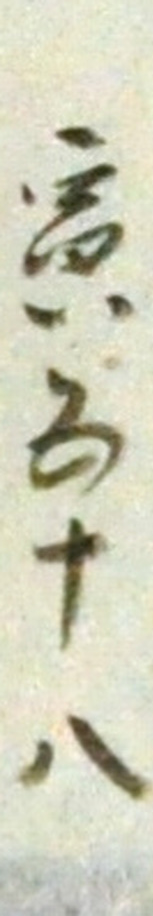寅五十八
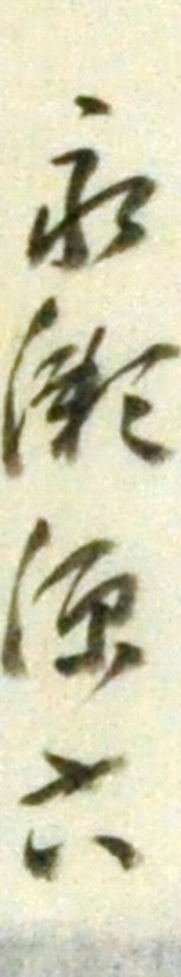永瀬源六
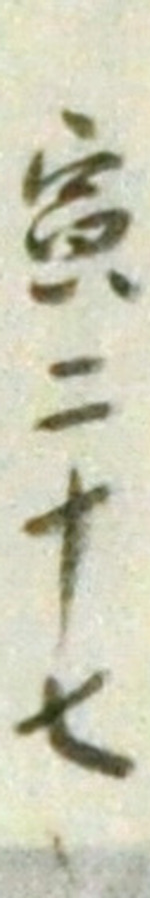寅二十七
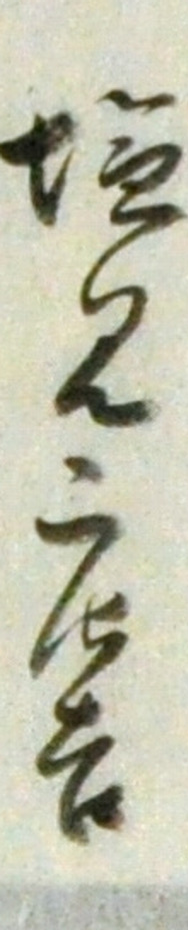塩見庄吉
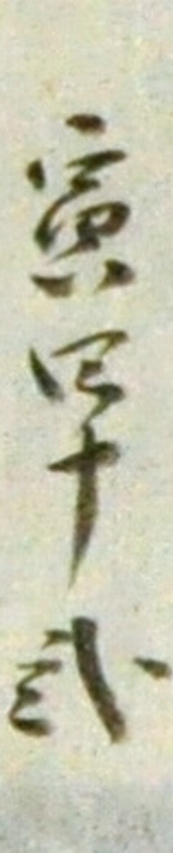寅四十弐
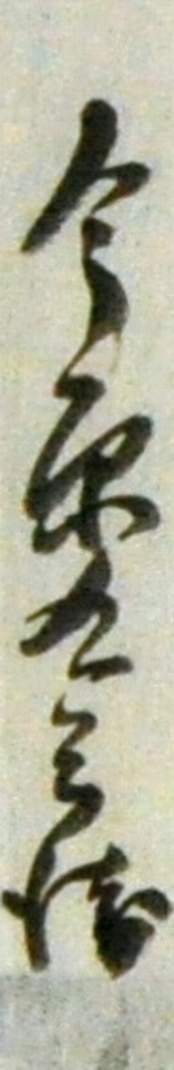今原九兵衛
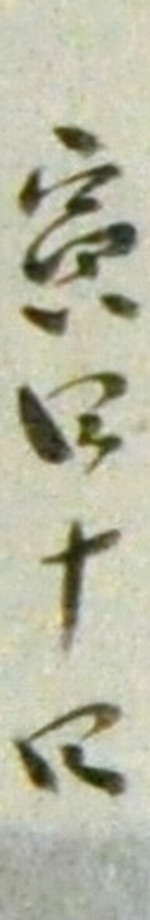寅四十四
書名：罪状判決
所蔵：伊那市立高遠町図書館・合同会社AMANE
